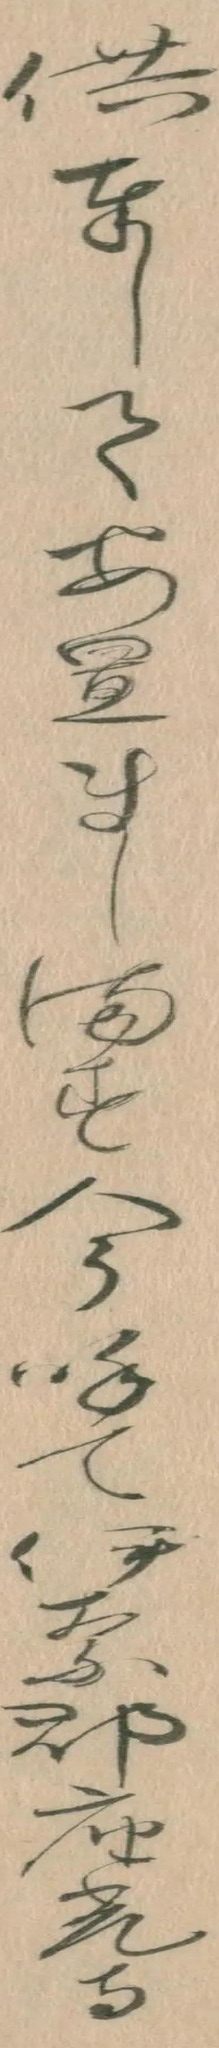供奉して安置まします今呼て伊奈郡座光寺
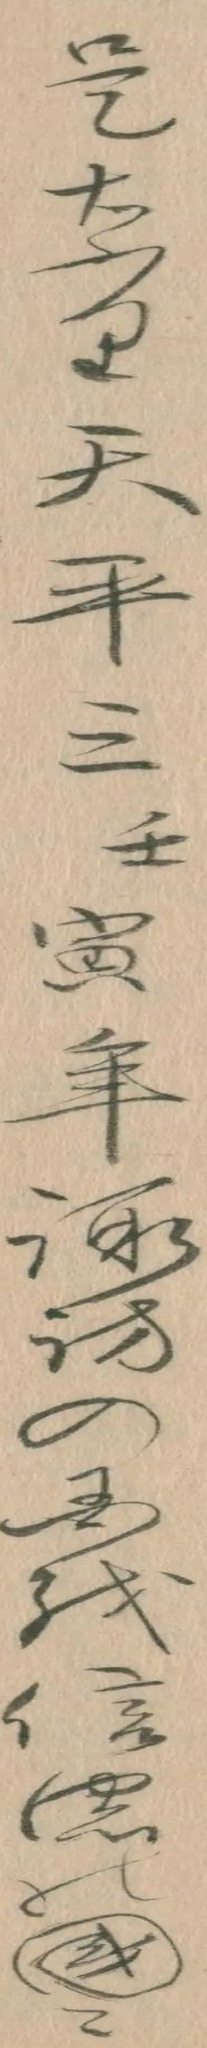是なり天平三壬寅年諏訪の国を信濃の国に
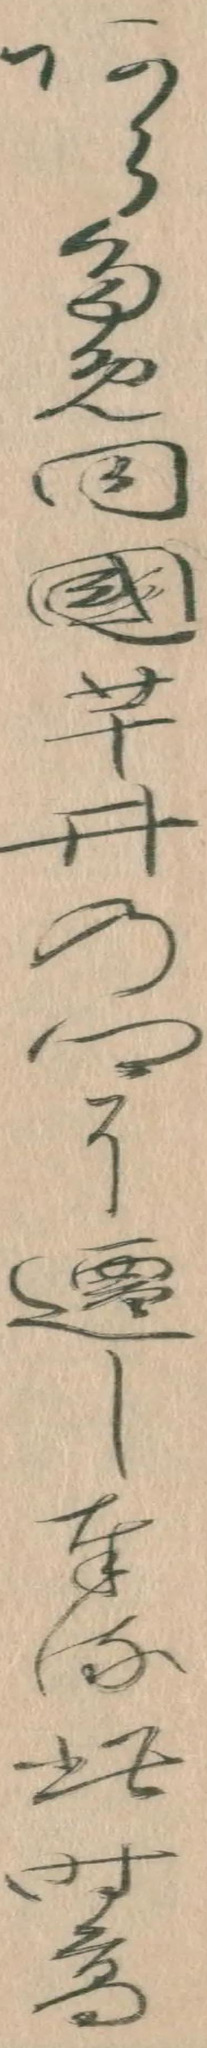あらため同国芋井の郷に遷し奉る此時高
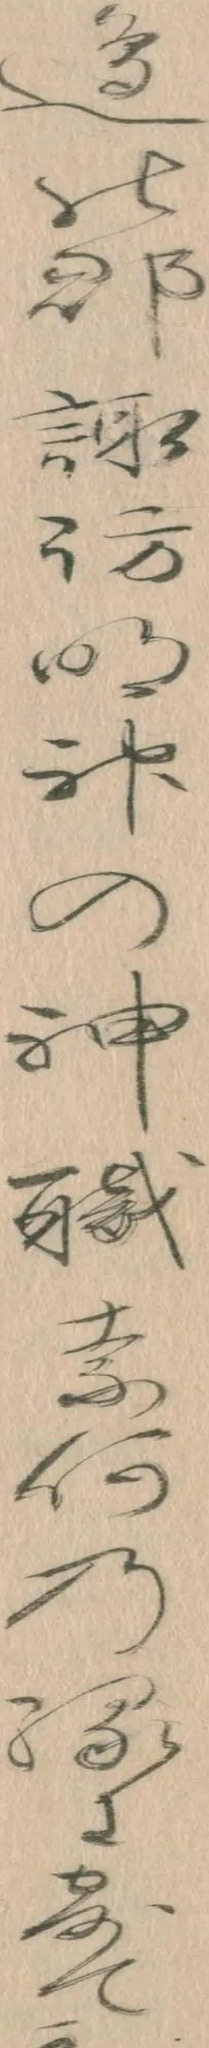島の郡諏訪明神の神職奈何の縁に寄てか
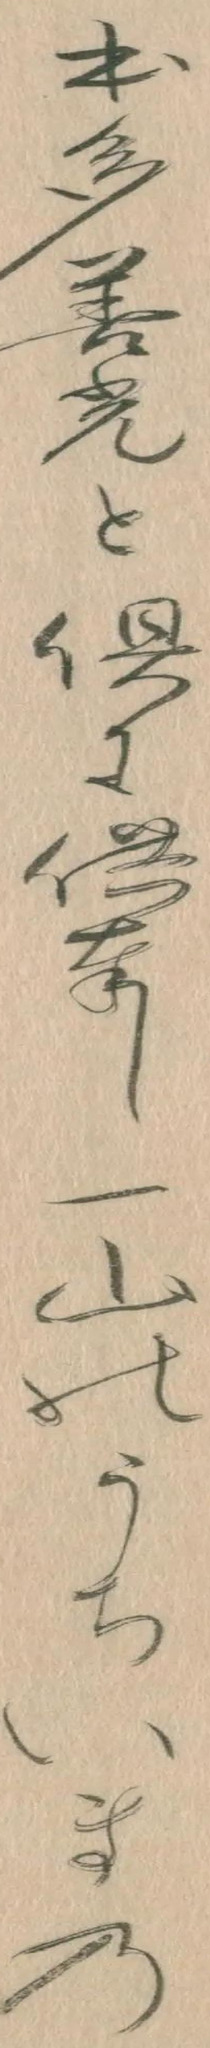本多善光と倶に供奉し一山のうちいまの
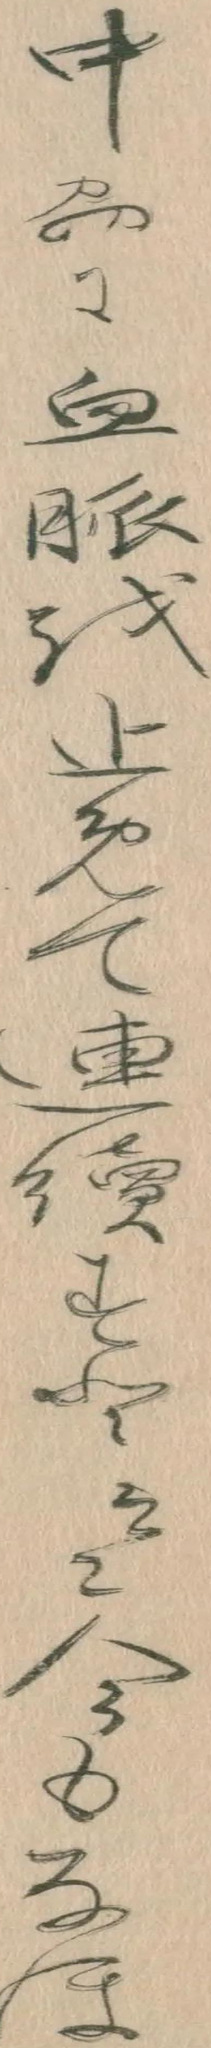中州に血脈を止めて連続すと云々今もなほ
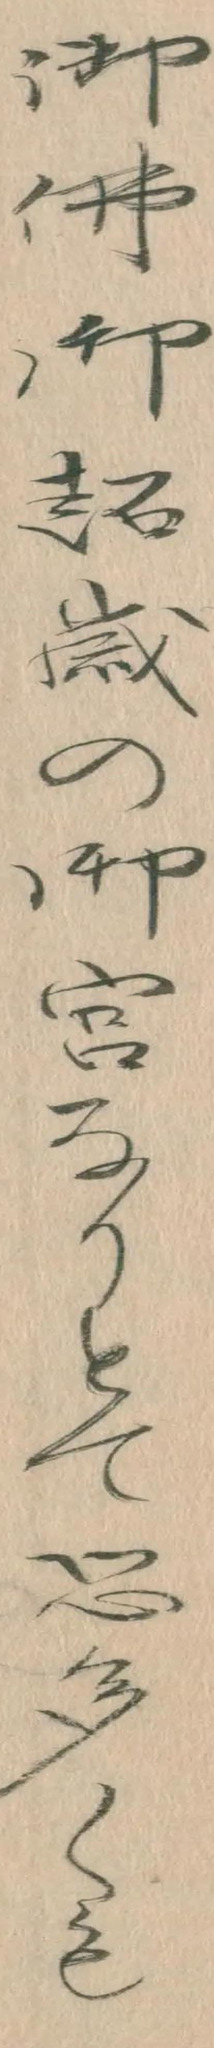御仏御超歳の御宮なりとて恐多くも
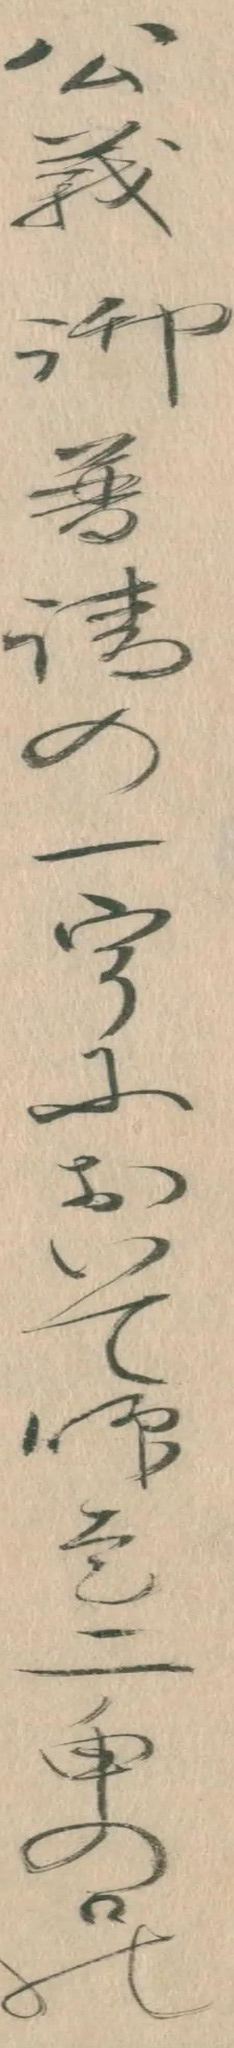公義御普請の一宇において師走二ノ申の日の
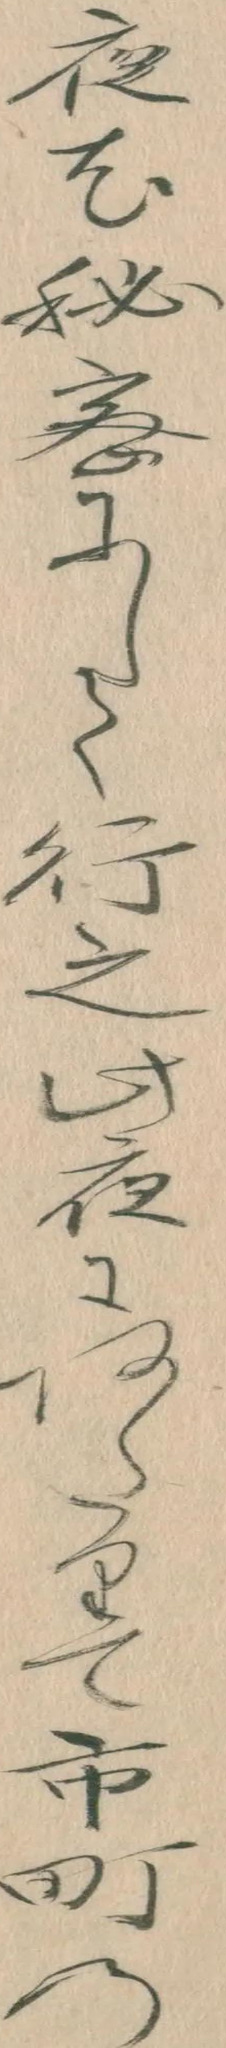夜尤秘密にして行之此夜にあたりて市町の
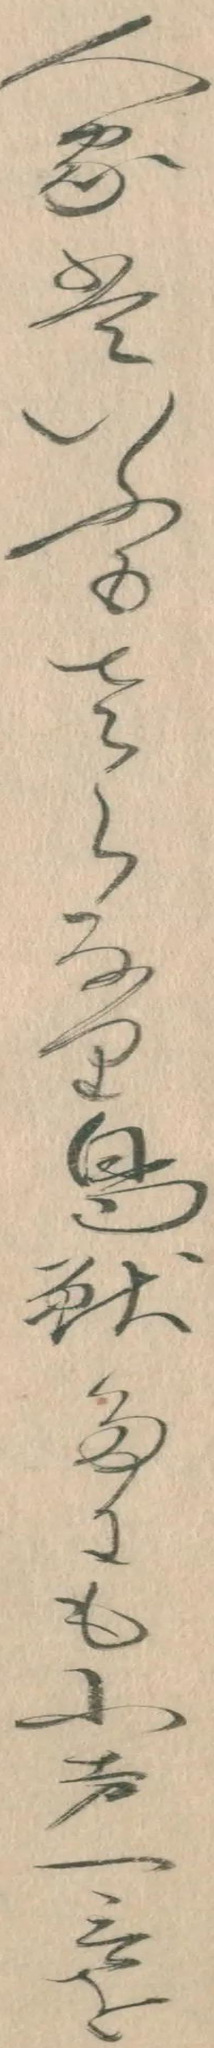人家はいふもさらなり鳥獣たにも小声一言を
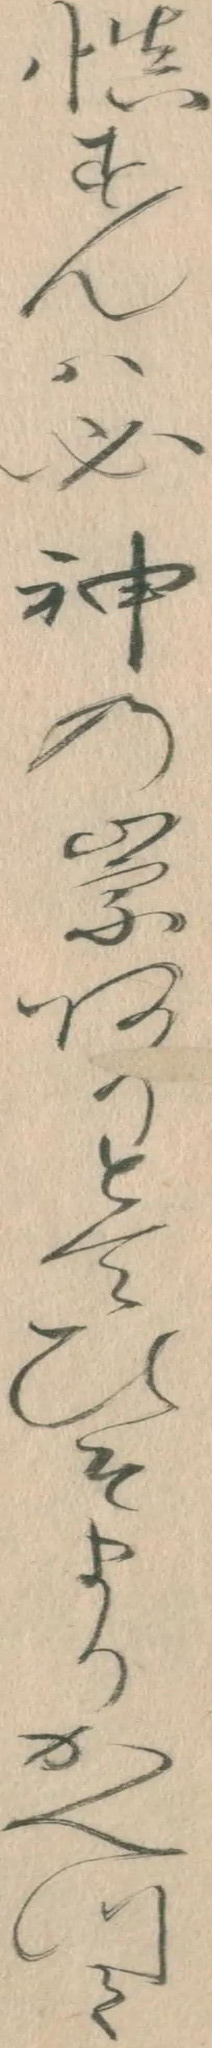慎すんは必神の崇ありとてひそまりかへつて
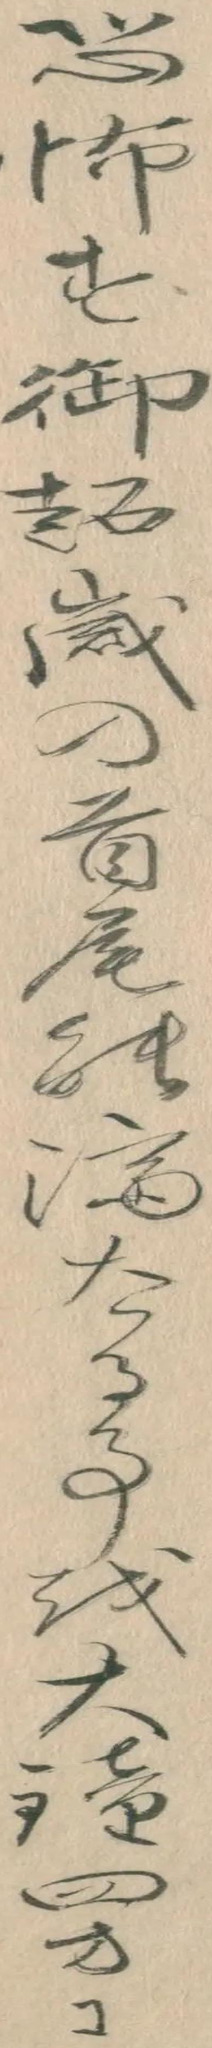恐怖す御超歳の首尾能済たる事を大鐘四方に

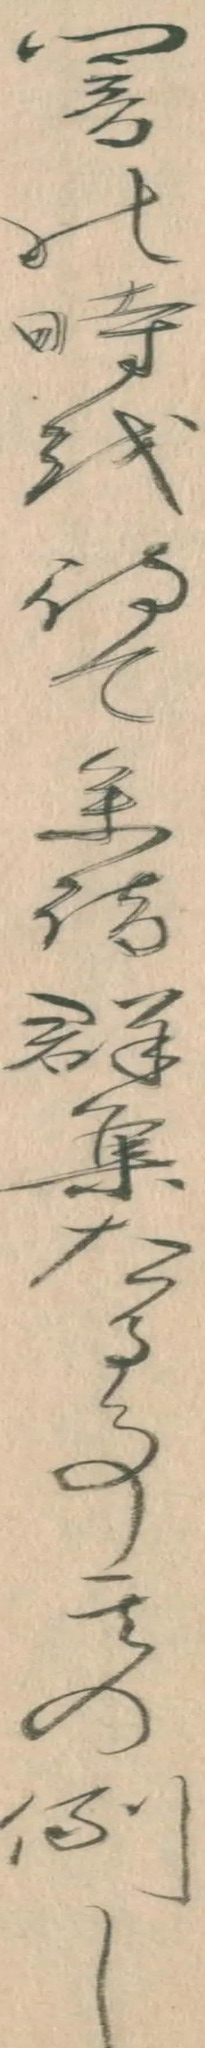響の時を待て参詣群集たる事其例し
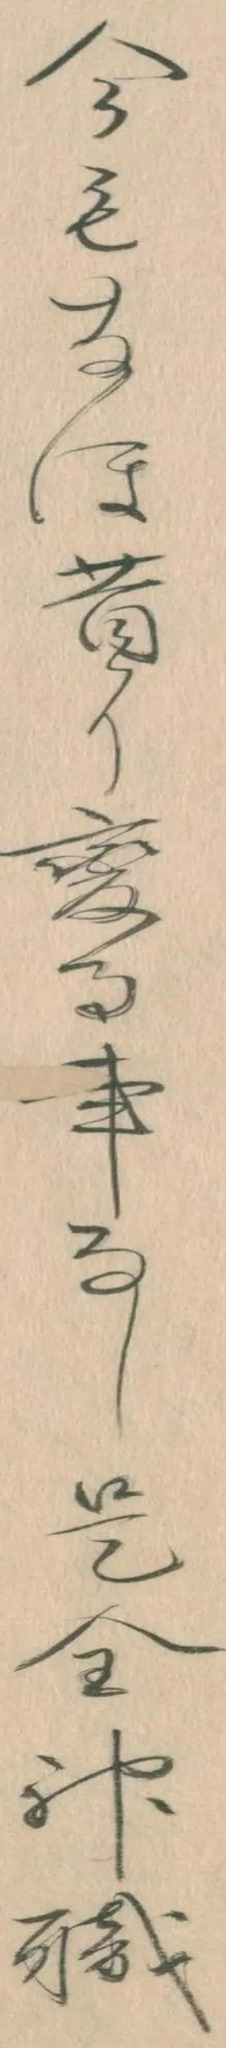今もなほ昔に変る事なし是全神職
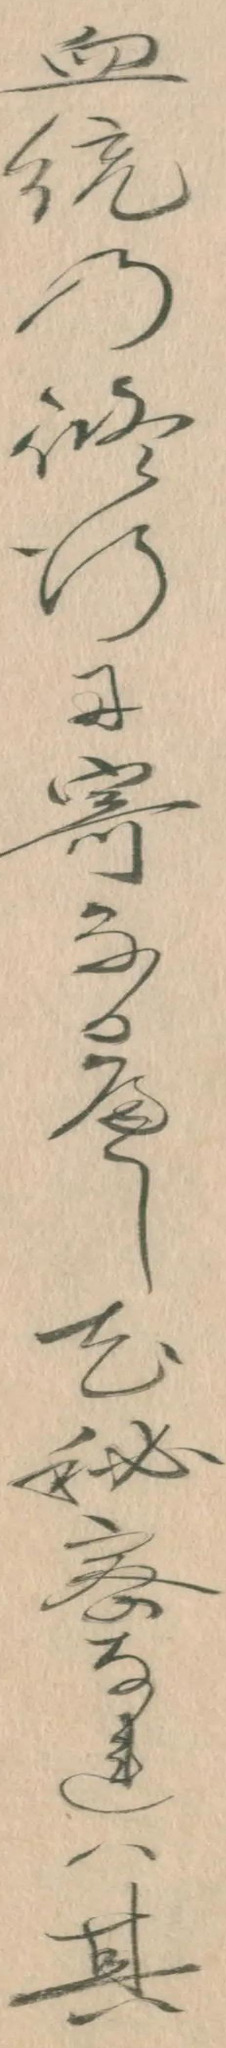血統の修行に寄なるへし尤秘密なれは其
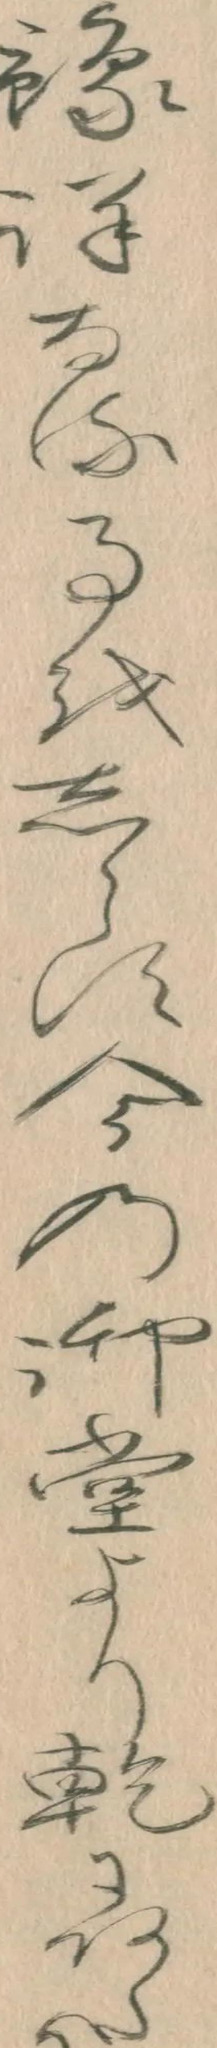予詳なる事をしらす今の御堂より乾にあたり
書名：俗語之種. [1]
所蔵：国立国会図書館 National Diet Library, JAPAN
